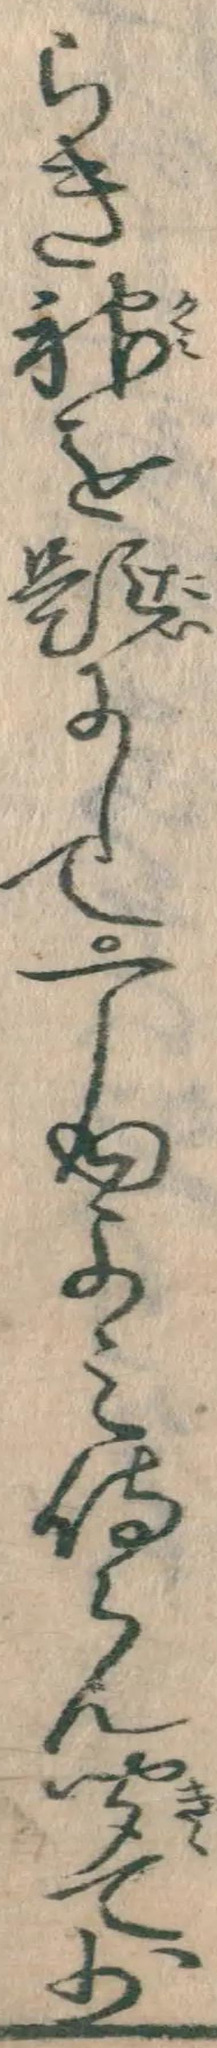らき神を題にして。一しゆよみ侍らん聞て少
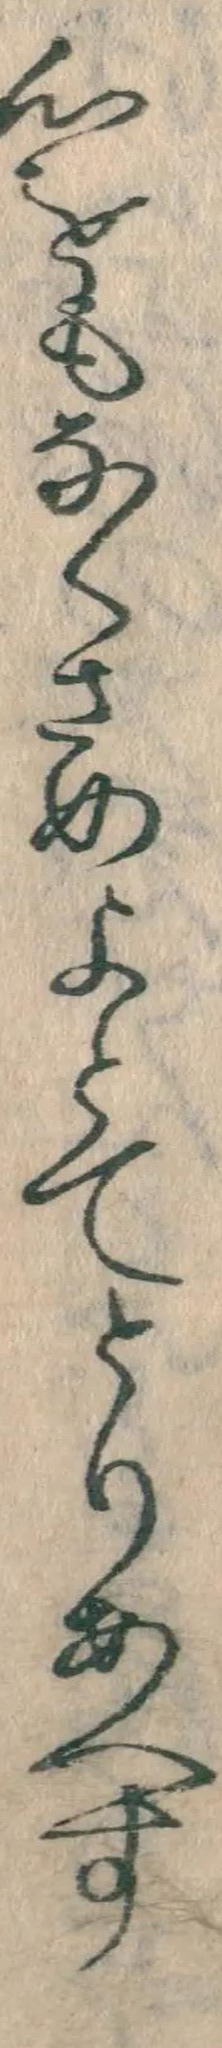心をもなくさめよとてとりあへす
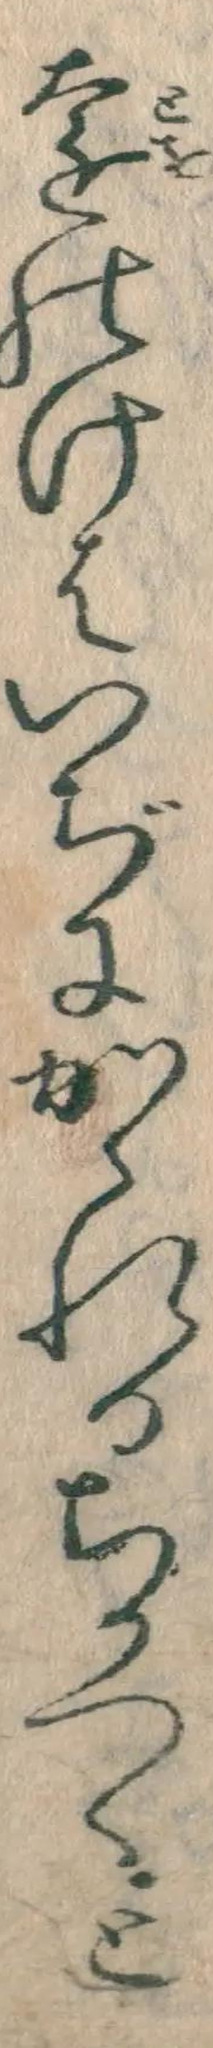遠のけはいぢにかゝれるちかつくと
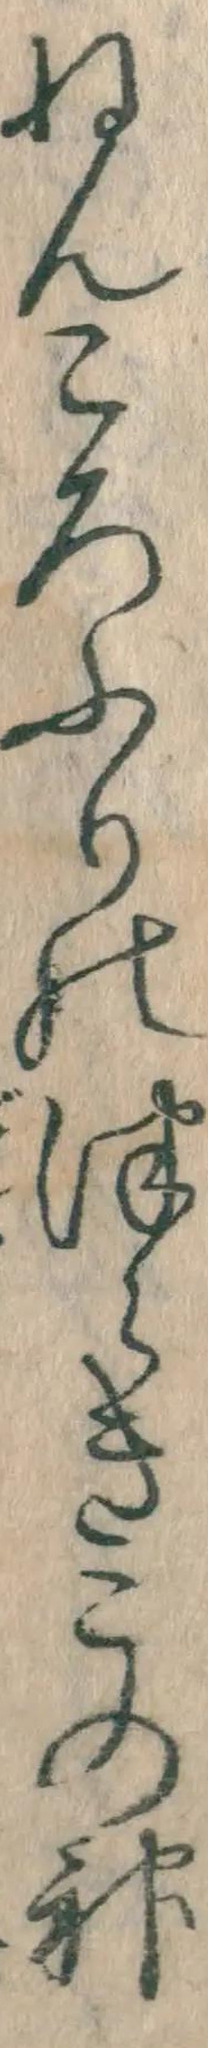ねんころふりのつらきこの神
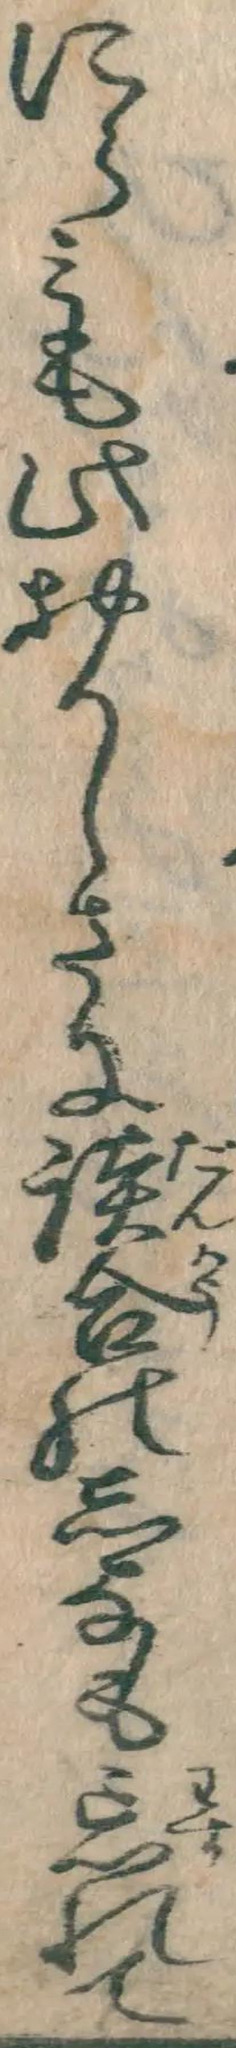にらみも此おかしさに談合のしなも忘れて

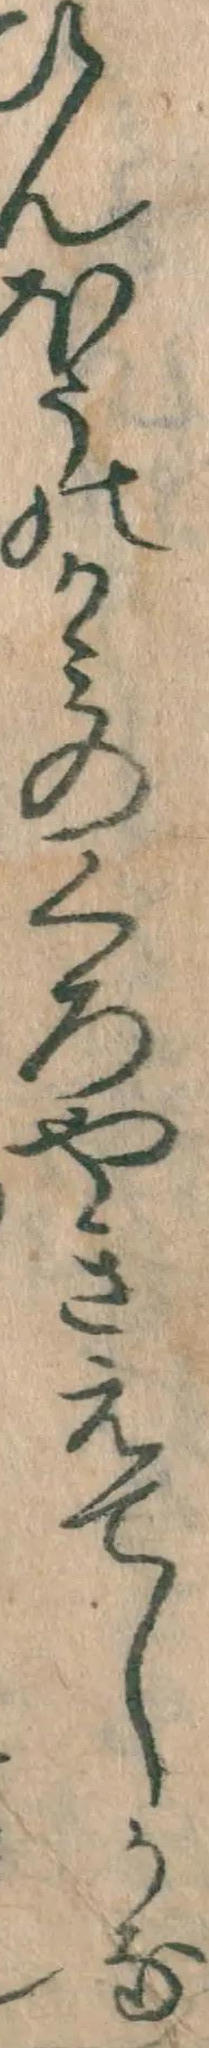ひんほうのかみのくろやきえてしかな
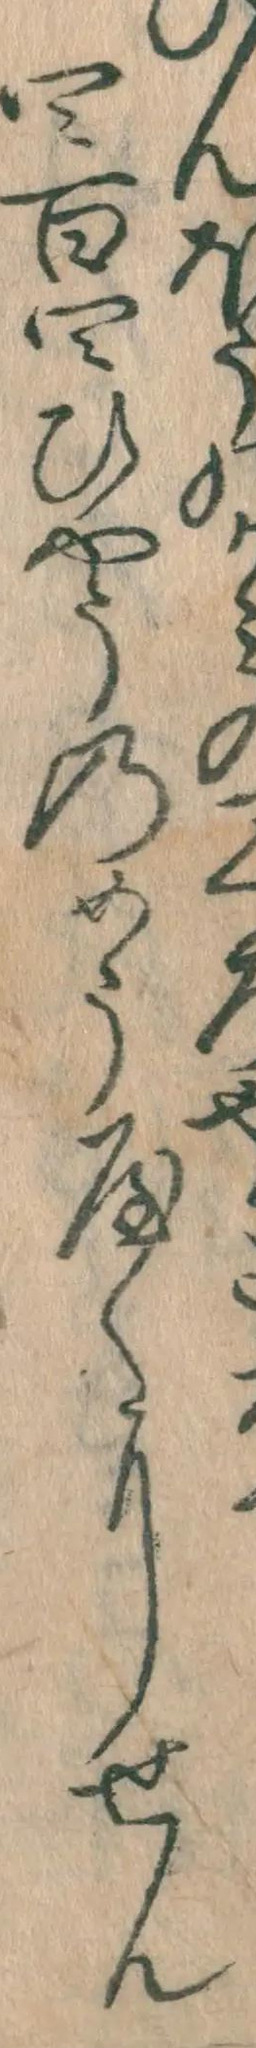四百四ひやうのめうやくにせん
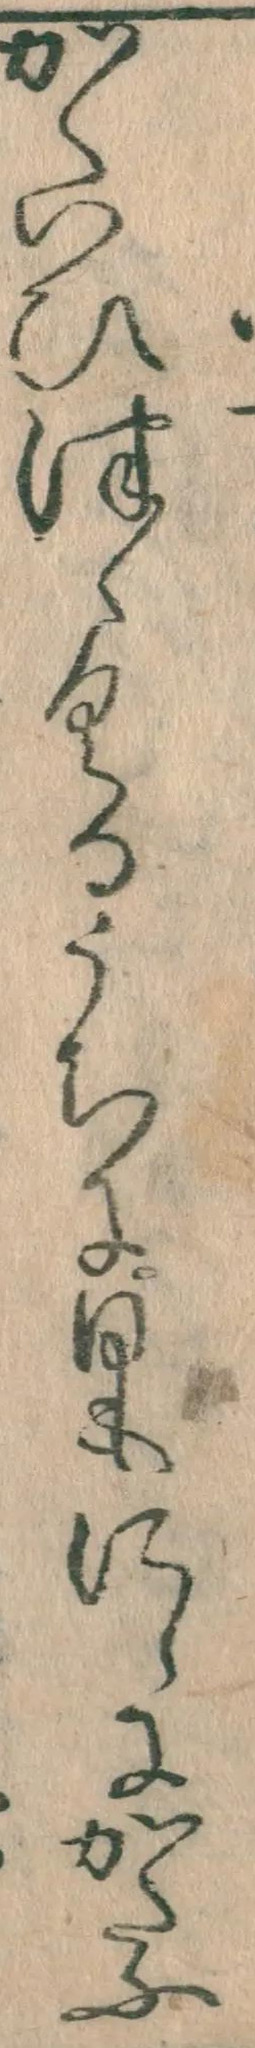かくいひつゝくるうちに。日もにしにかたふ
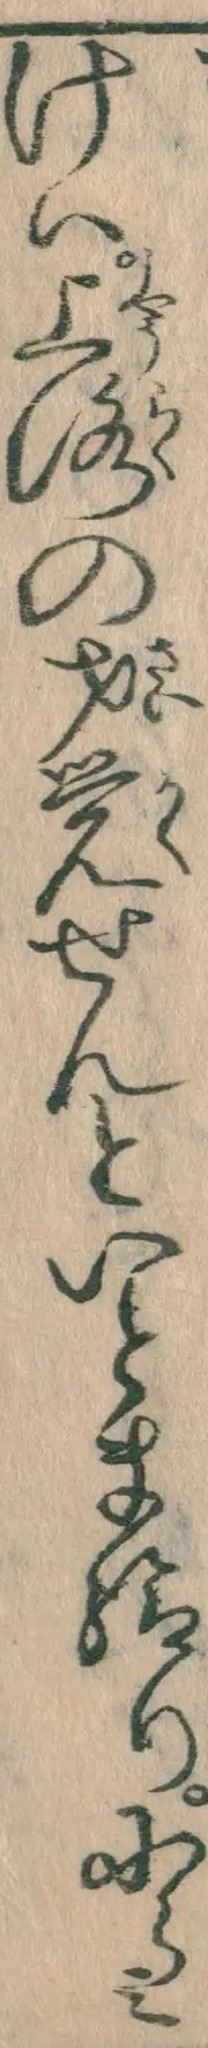けは。上洛の才覚せんといとま給り。にらみ
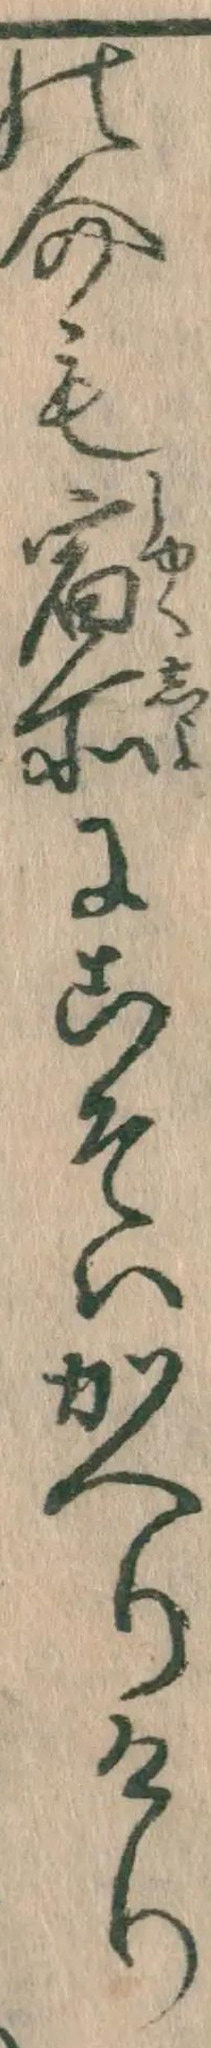の介も宿所にこそはかへりけり
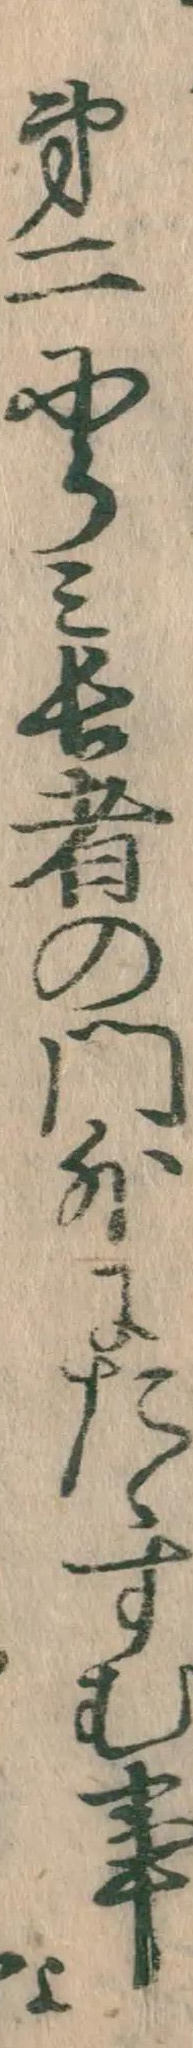第二にらみ長者の門外にたゝすむ事
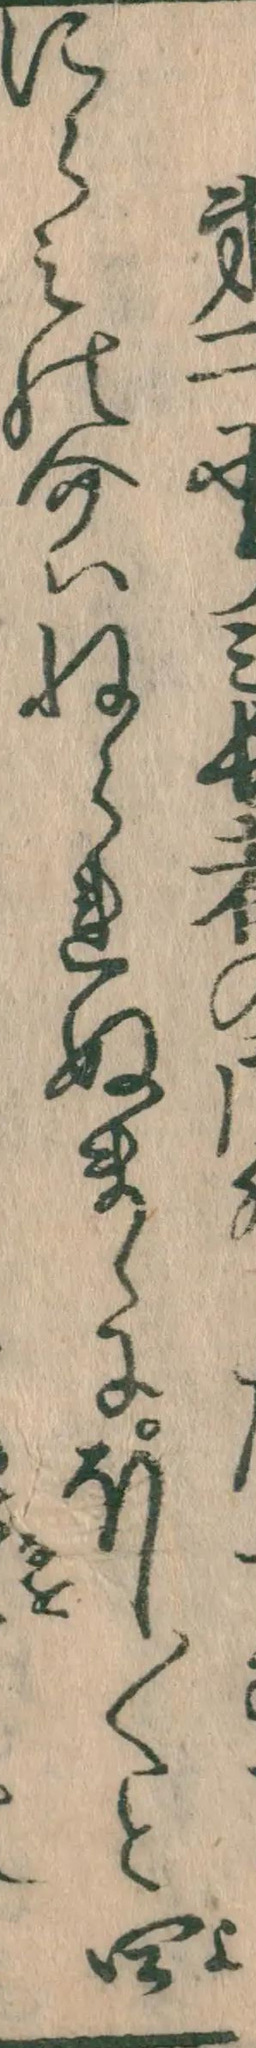にらみの介はねられぬまゝに。ほし〳〵と四
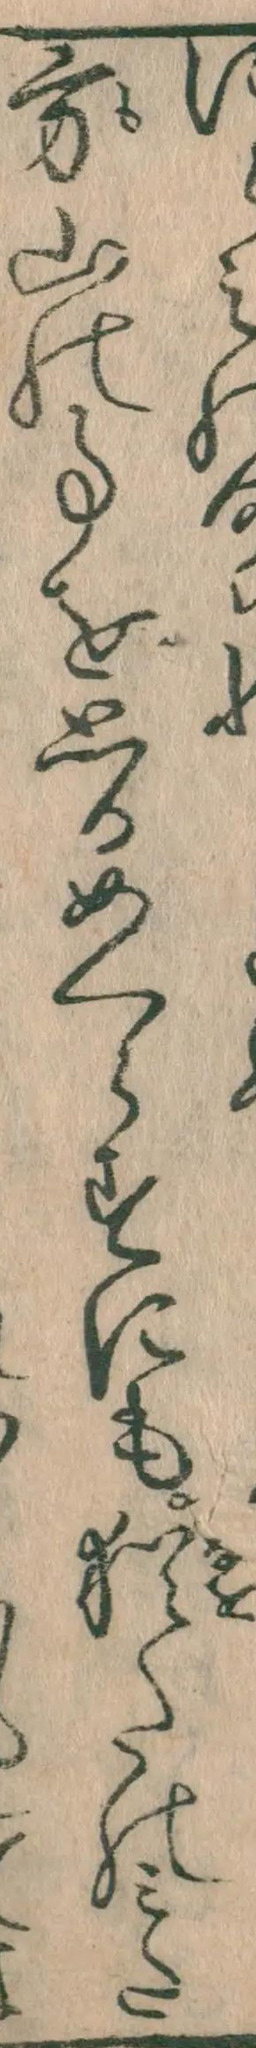方山の事を思ひめくらすにも。猶たのみた
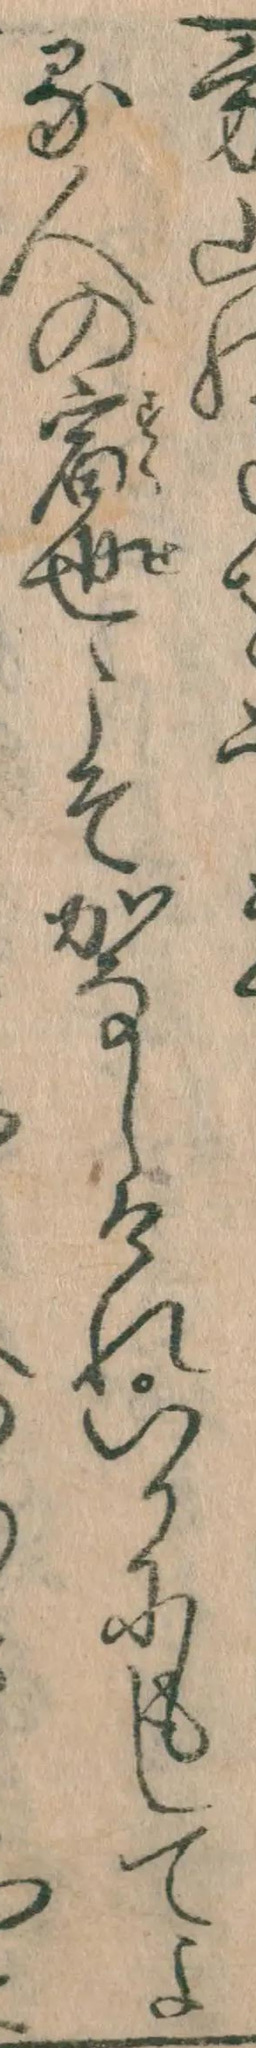る人の宿世こそかなしけれ。いかにもしてよ
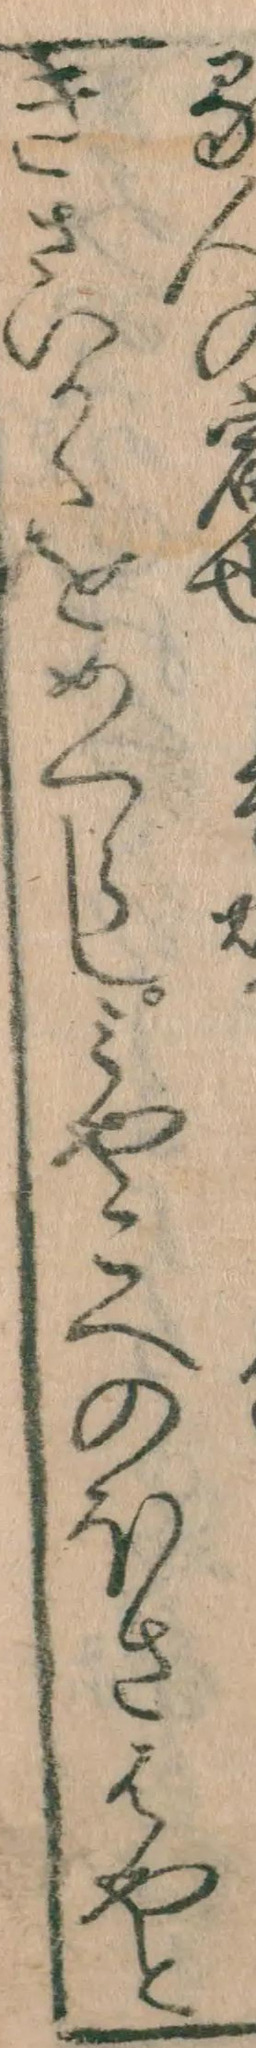きさいかくをめくらし。みやこへのほさはやと

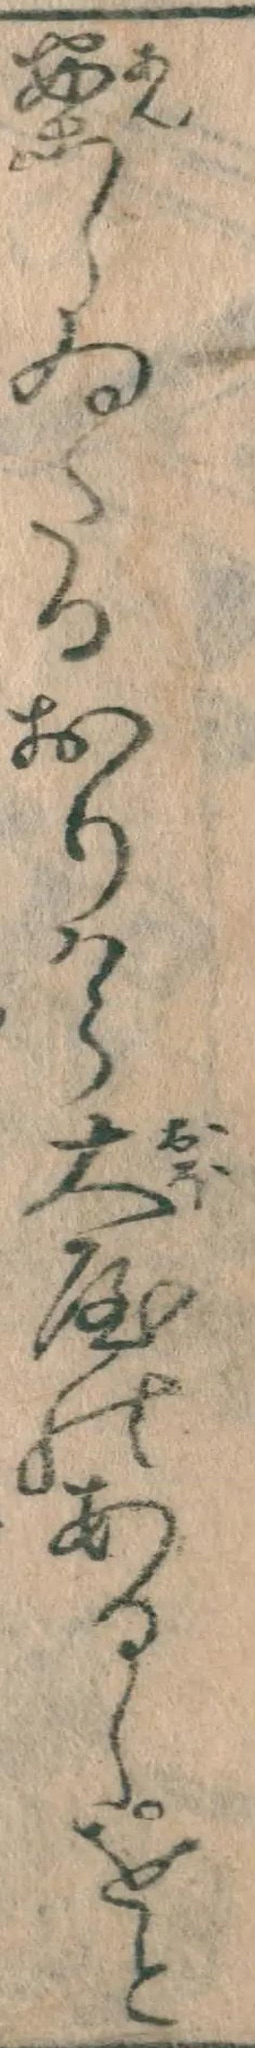案しゐたるおりから大屋のあるし。をと
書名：竹斎狂歌物語 3巻
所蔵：国立国会図書館 National Diet Library, JAPAN
